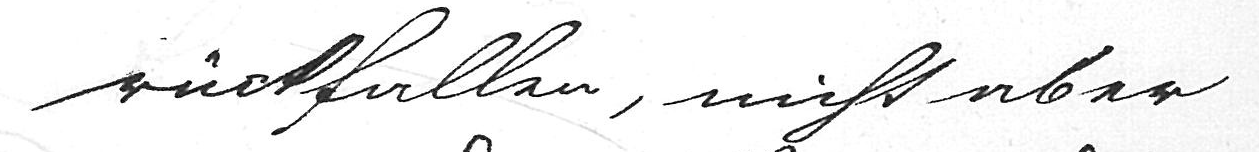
rückfallen, nicht aber
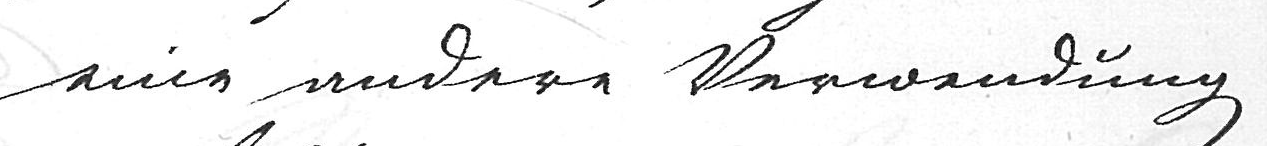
eine andere Verwendung
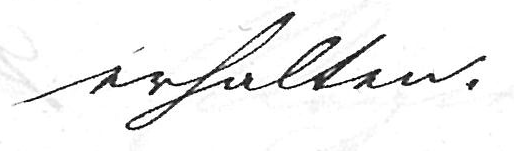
erhalten.
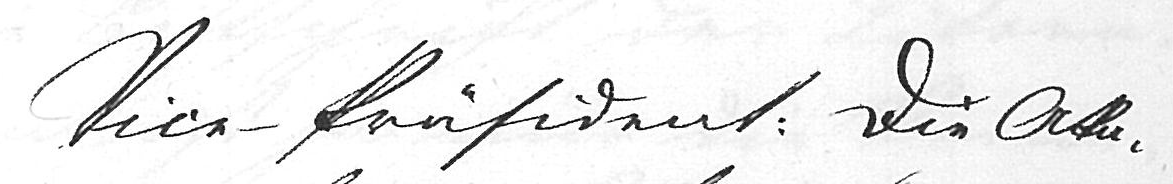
Vice-Präsident: Die Aka-
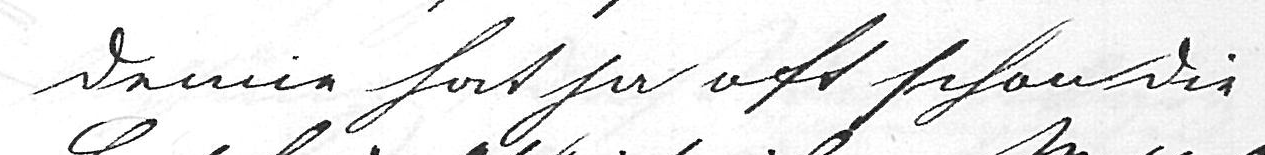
demie hat ja oft schon die
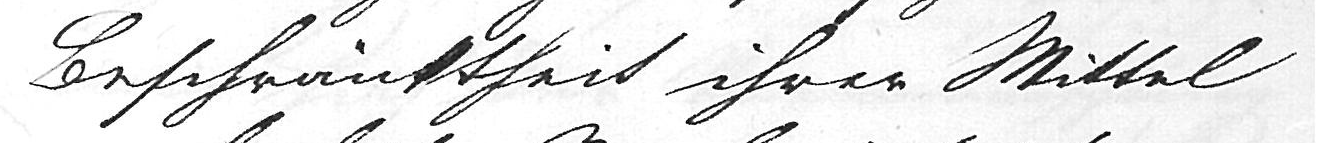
Beschränktheit ihrer Mittel
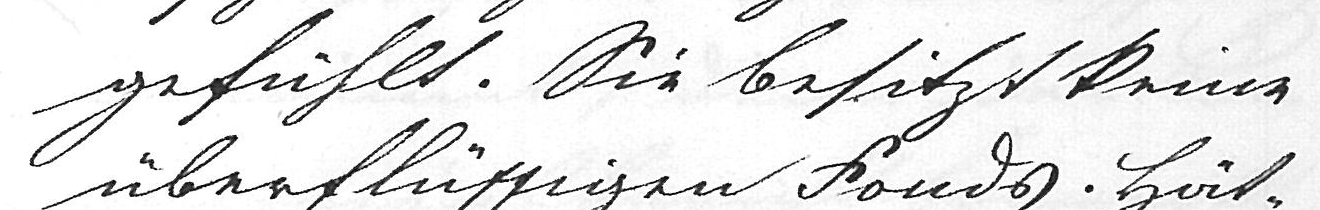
gefühlt. Sie besitzt keine
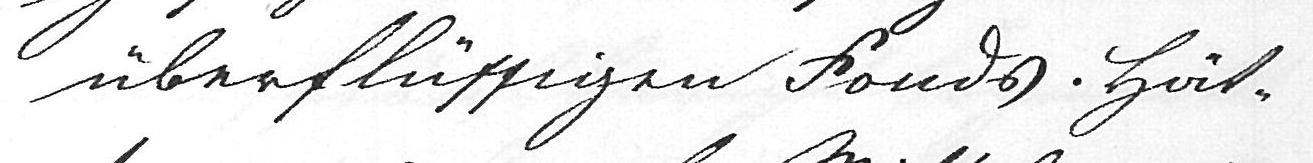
überflüssigen Fonds. Hät-
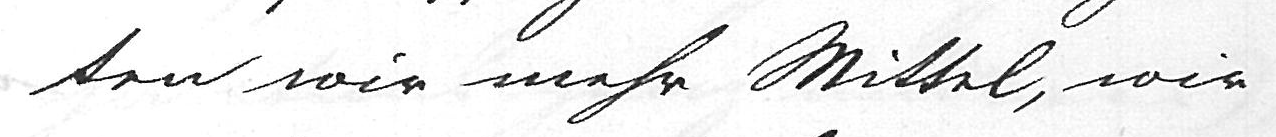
ten wir mehr Mittel, wir
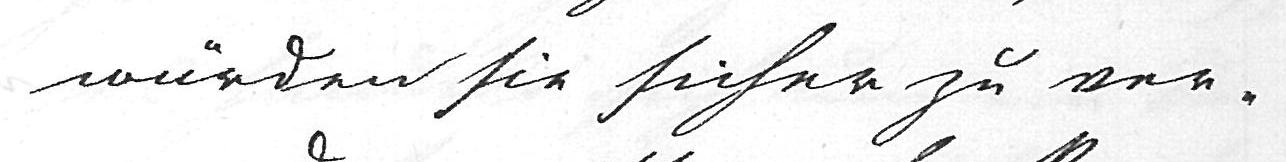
wurden sie sicher zu ver
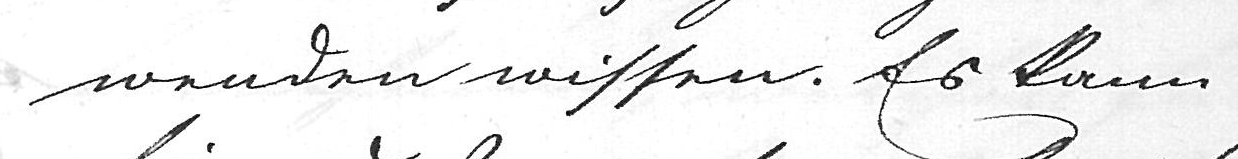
wenden wissen. Es kann
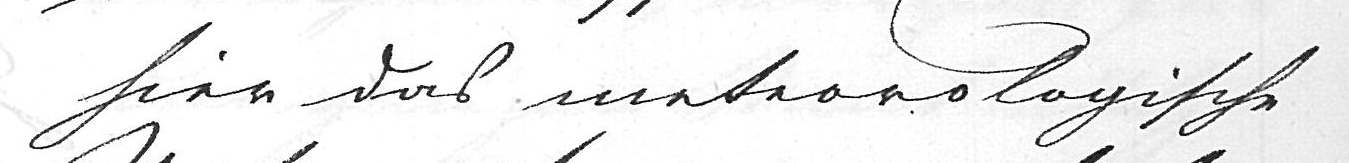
hier das meteorologische
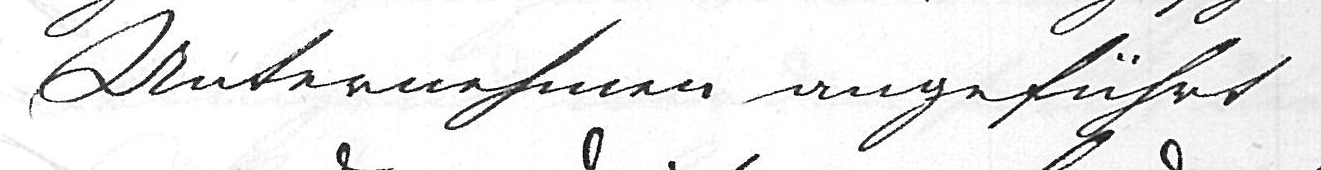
Unternehmen angeführt
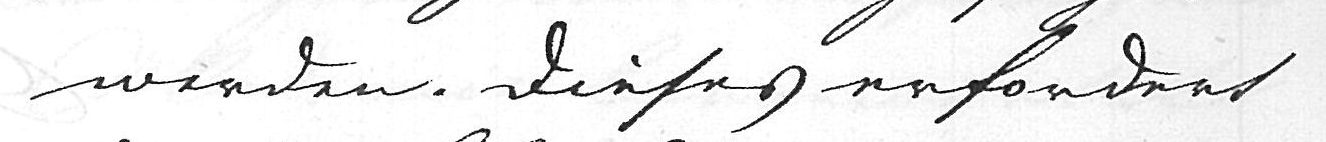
werden. Dieses erfordert
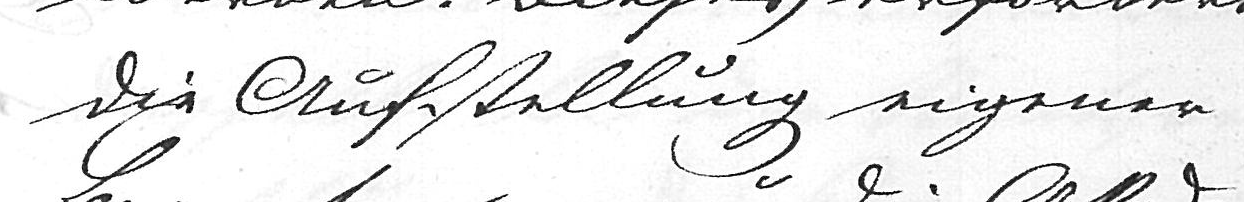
die Aufstellung eigener
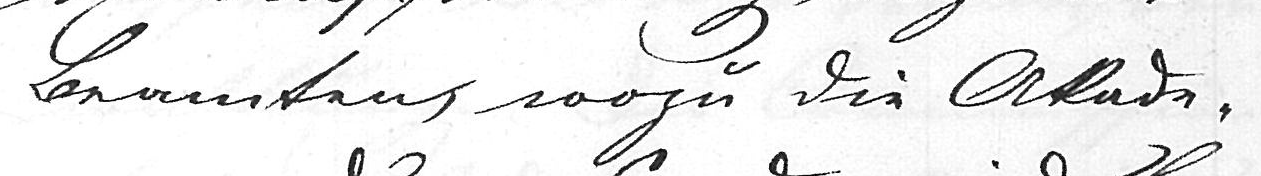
Beamten, wozu die Akade-
